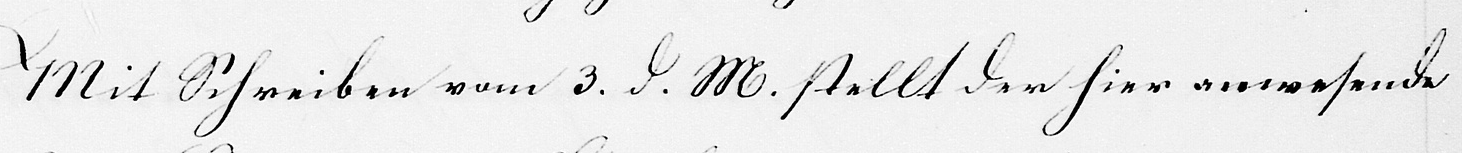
Mit Schreiben vom 3. d. M. stellt der hier anwesende
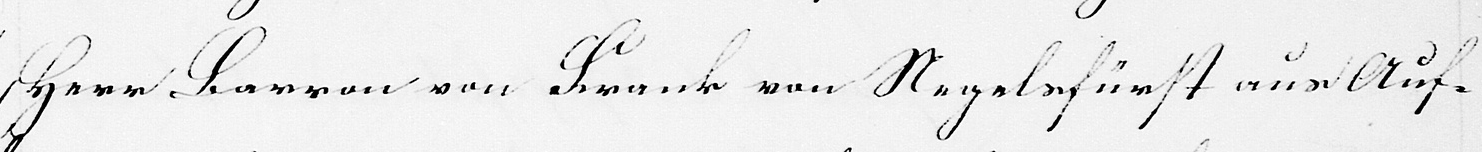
Herr Barron von Frank von Negelsfürst aus Auf¬
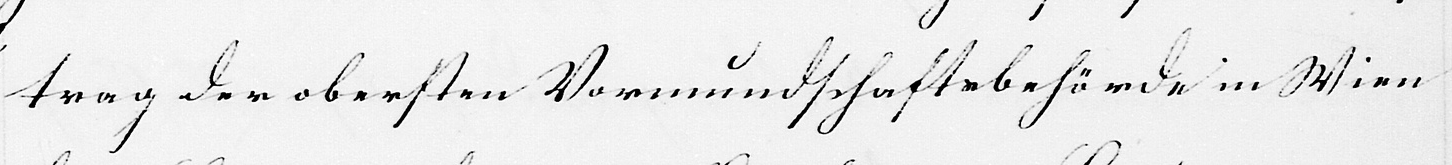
trag der obersten Vormundschaftsbehörde in Wien
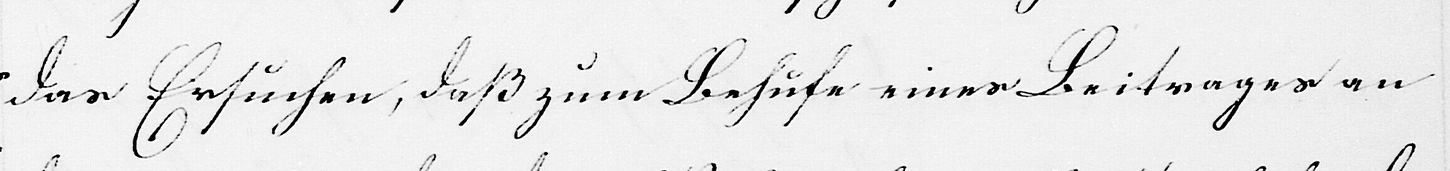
das Ersuchen, daß zum Behufe eines Beitrages an
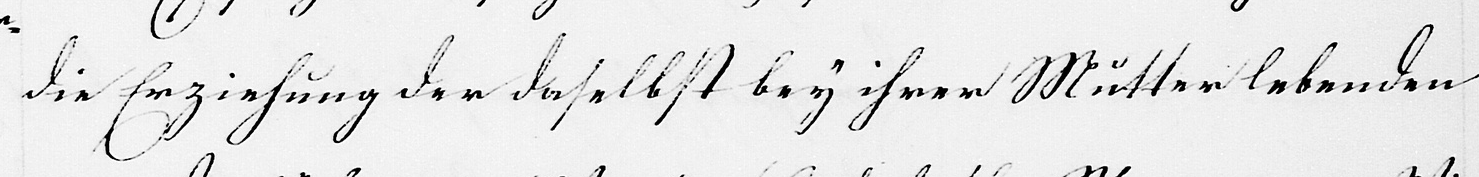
die Erziehung der daselbst bey ihrer Mutter lebenden
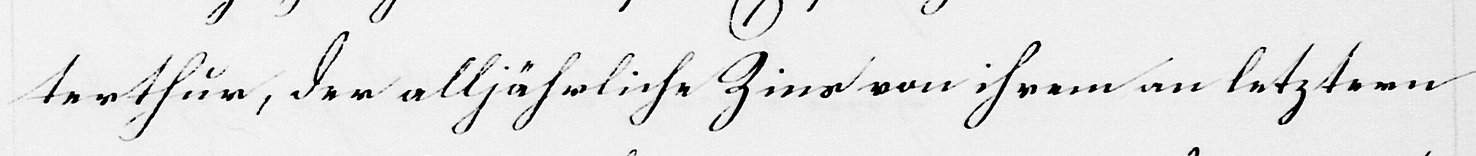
terthur, der alljährliche Zins von ihrem an letztern
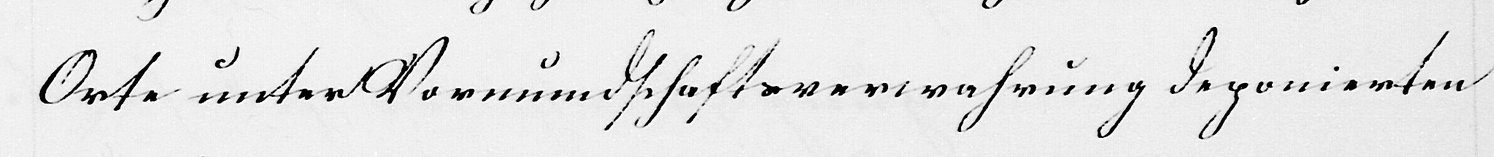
Orte unter Vormundschaftsverwahrung deponierten
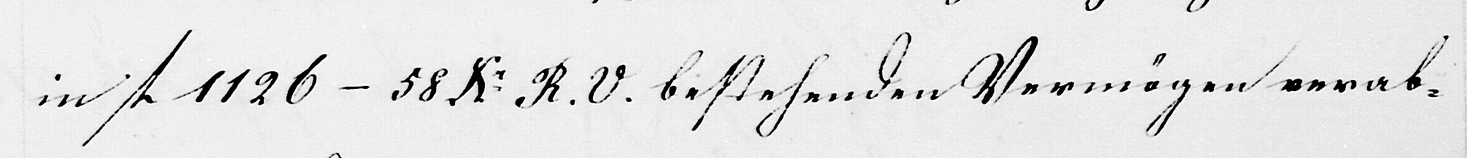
in fl 1126 – 58 Kr R. V. bestehenden Vermögen verab¬
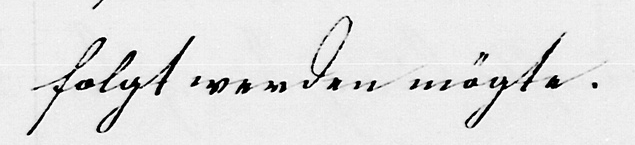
folgt werden mögte.
